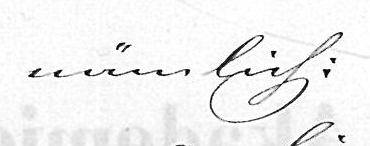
nämlich:
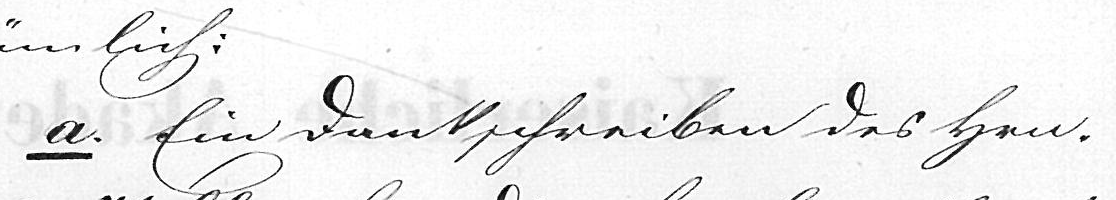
a. Ein Dankschreiben des Hrn.
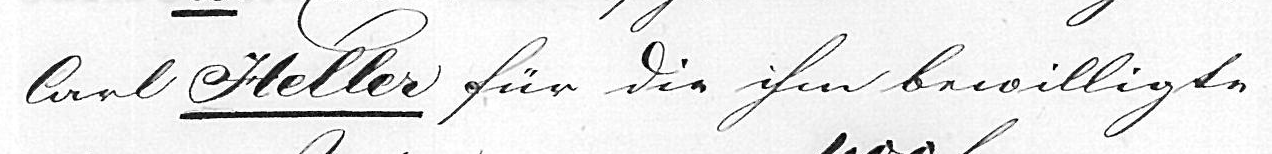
Carl Heller für die ihm bewilligte
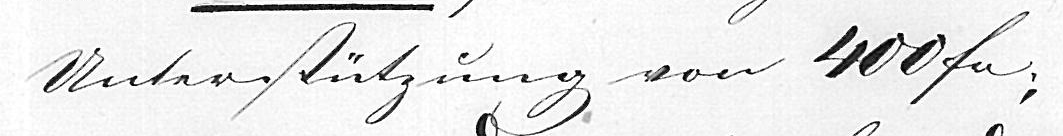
Unterstützung von 400 fr;
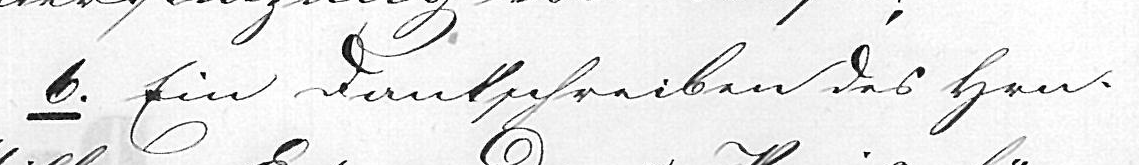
b. Ein Dankschreiben des Hrn.
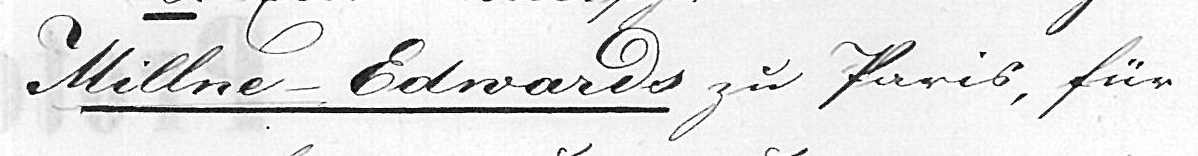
Millne-Edwards zu Paris, für
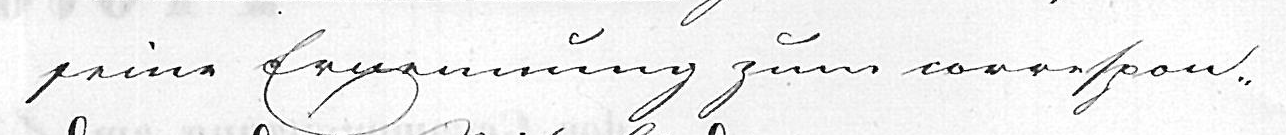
seine Ernennung zum correspon-
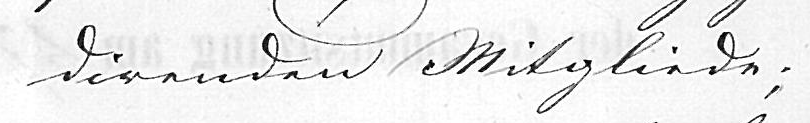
direnden Mitgliede;
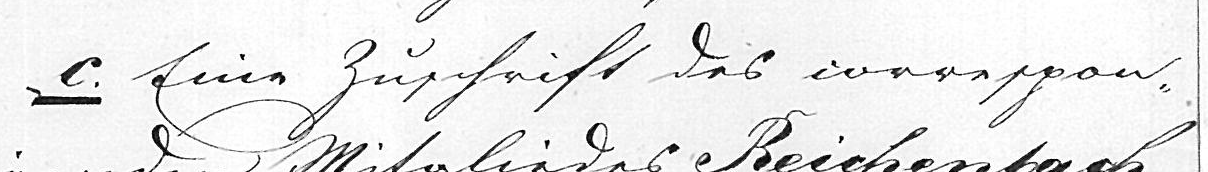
c. Eine Zuschrift des correspon-
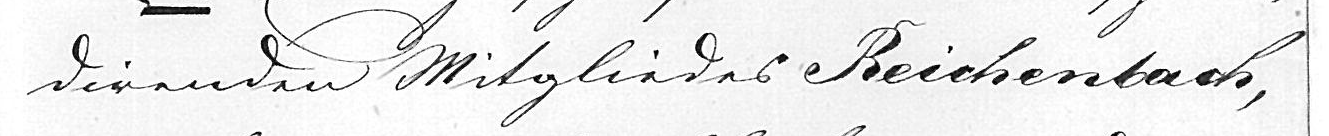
direnden Mitgliedes Reichenbach,
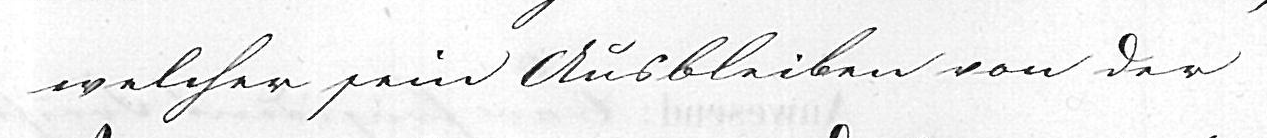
welcher sein Ausbleiben von der
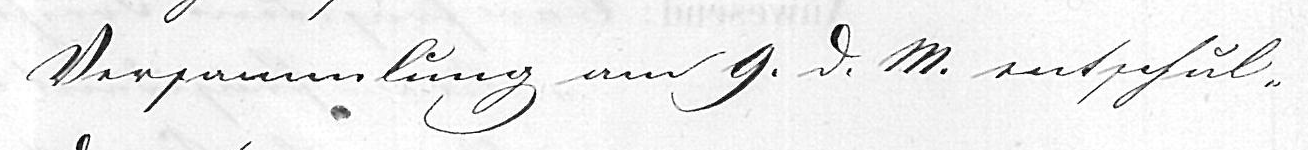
Versammlung am 9. d. M. entschul-
